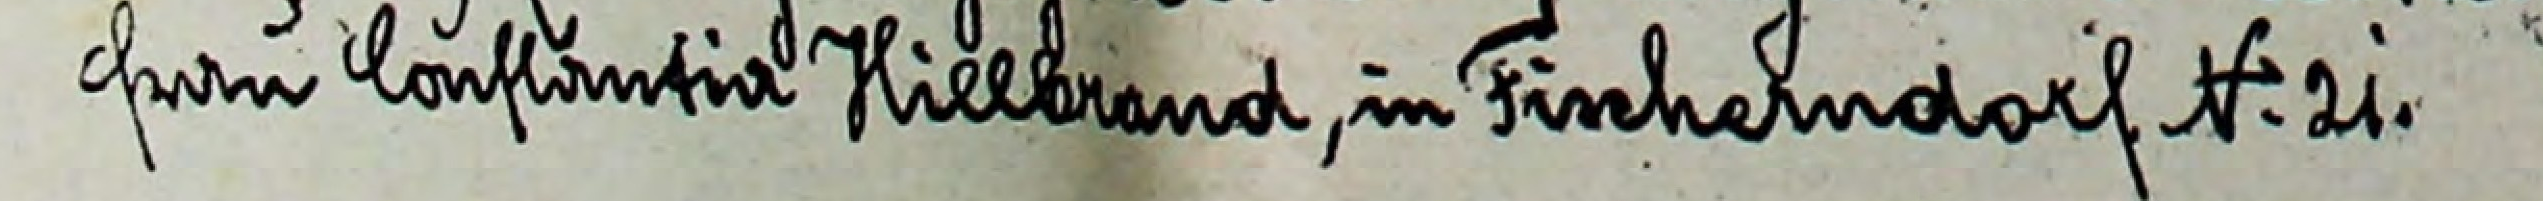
Frau Constantia Hillbrand, in Fischerndorf № 21.
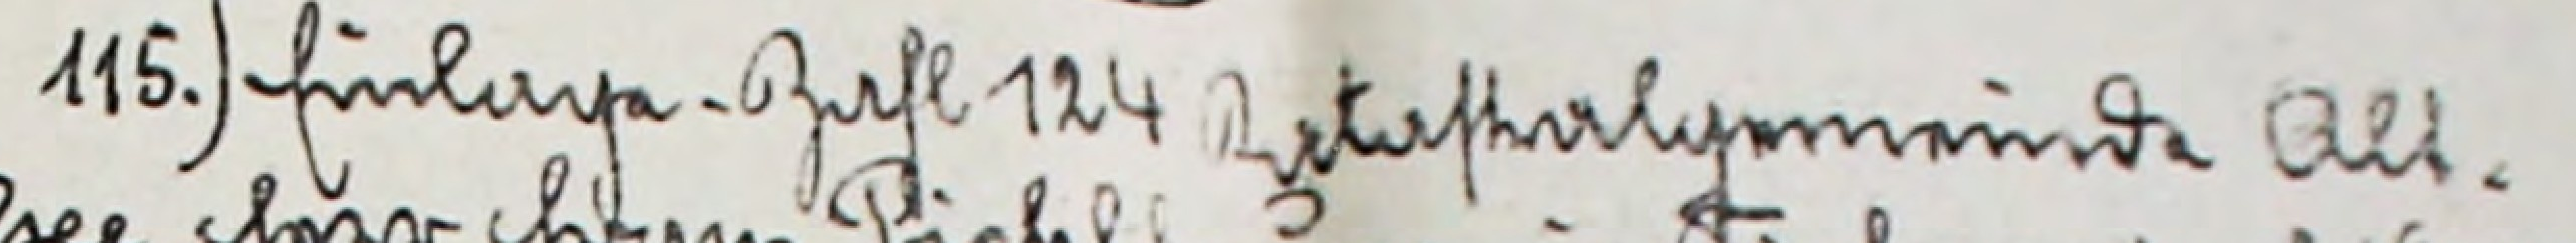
115.) Einlage - Zahl 124 Katastralgemeinde Alt=
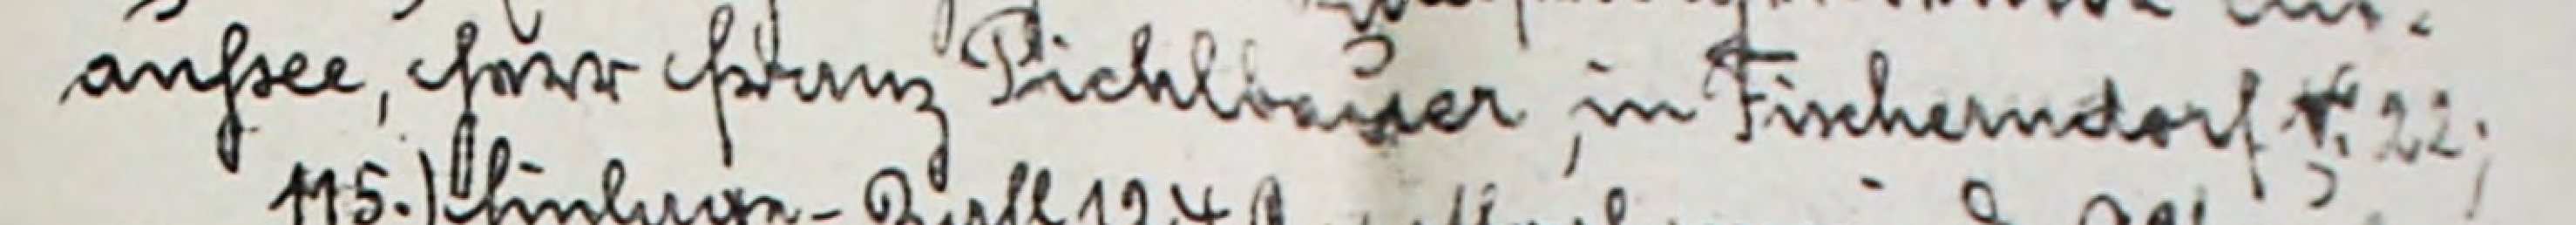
aussee, Herr Franz Pichlbauer, in Fischerndorf № 22;
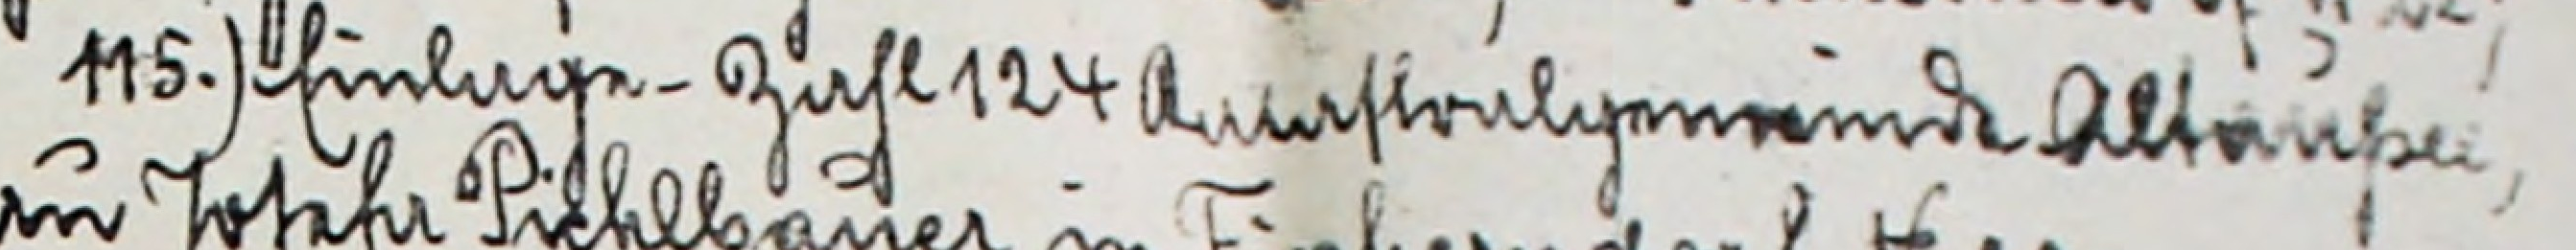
115.) Einlage - Zahl 124 Katastralgemeinde Altaussee,
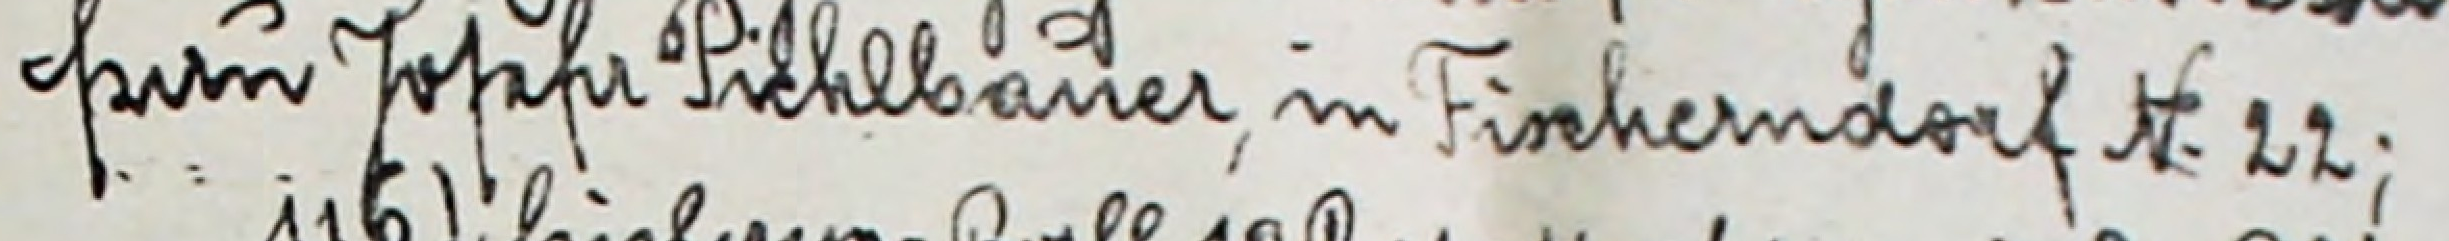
Frau Josefa Pichlbauer, in Fischerndorf № 22;
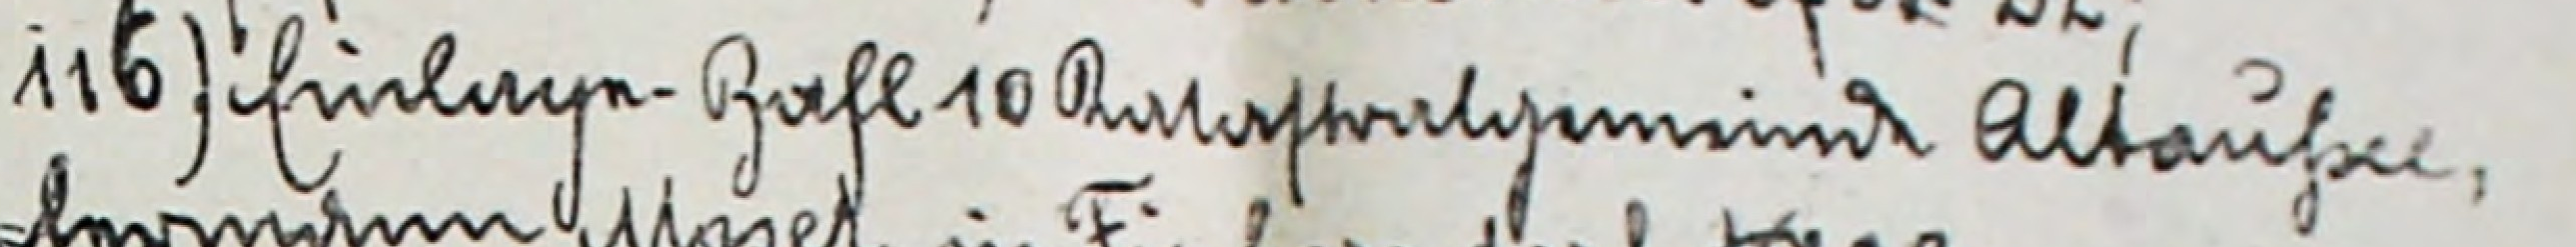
116) Einlage - Zahl 10 Katastralgemeinde Altaussee,
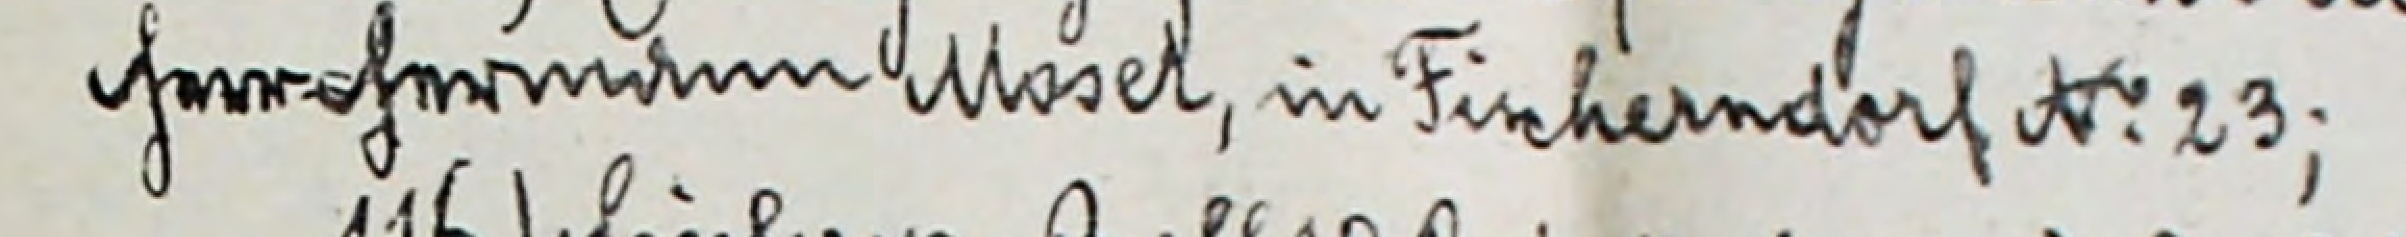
Herr Hermann Moser, in Fischerndorf № 23;
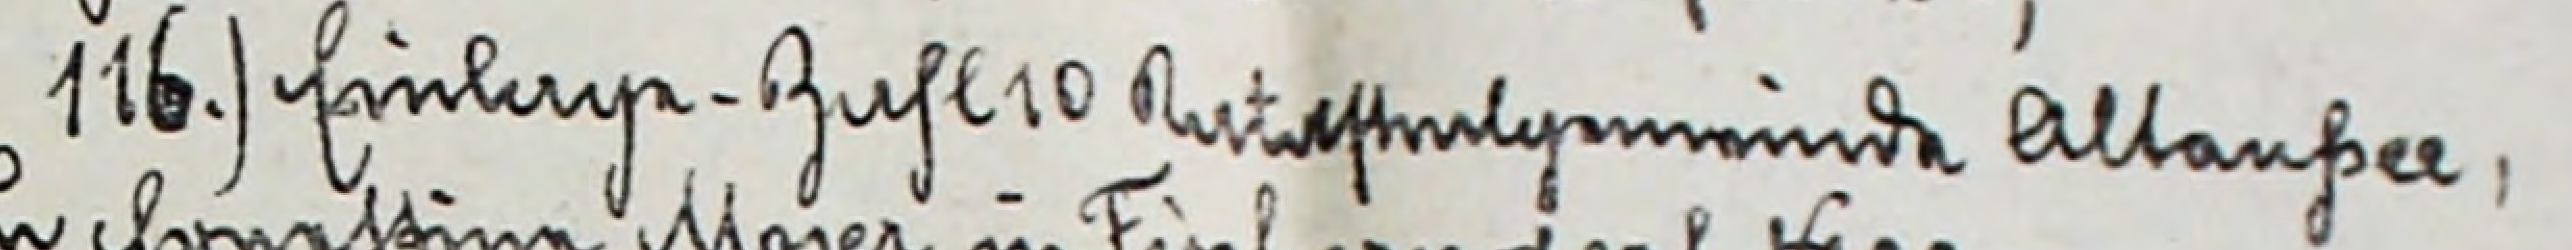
116.) Einlage - Zahl 10 Katastralgemeinde Altaussee,
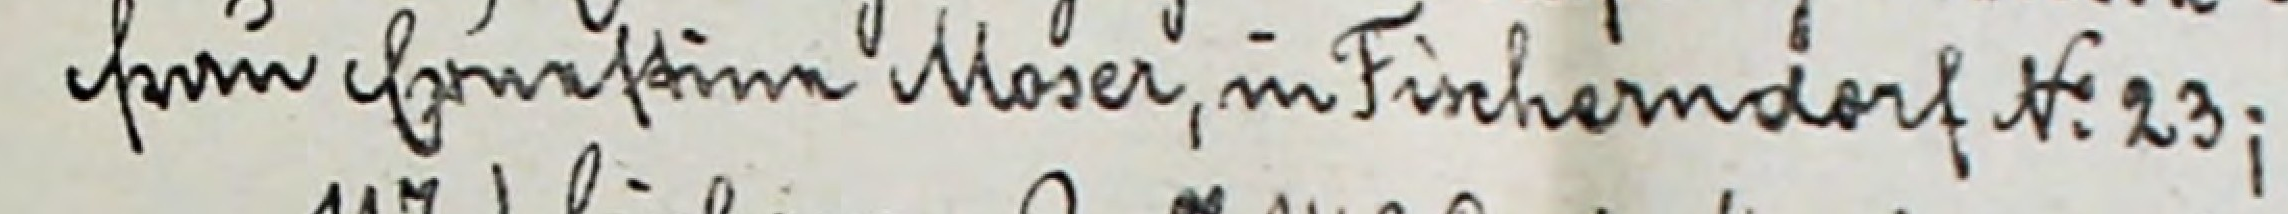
Frau Ernestine Moser, in Fischerndorf № 23;
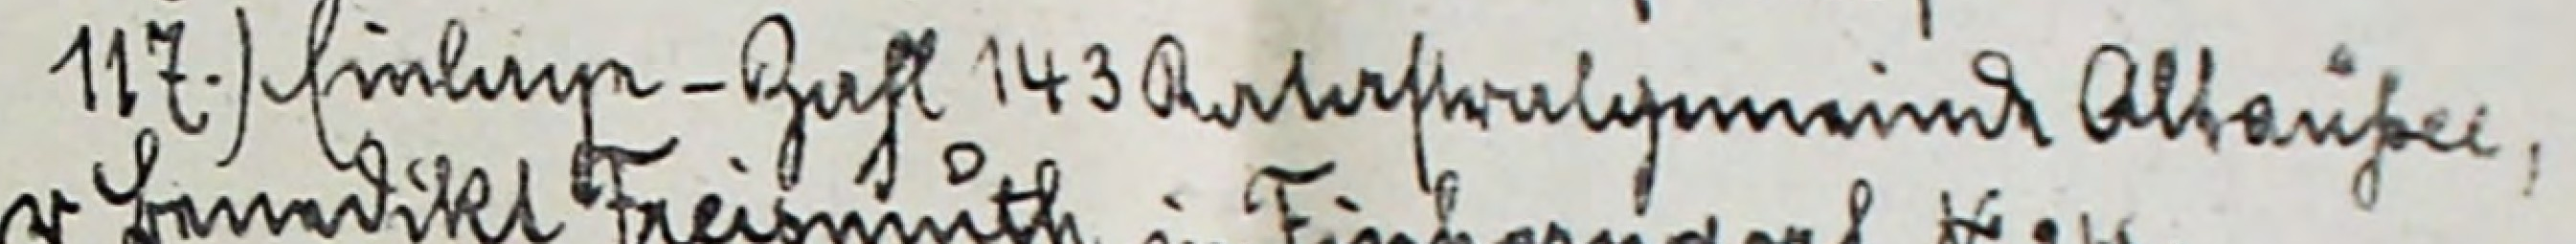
117.) Einlage - Zahl 143 Katastralgemeinde Altaussee,
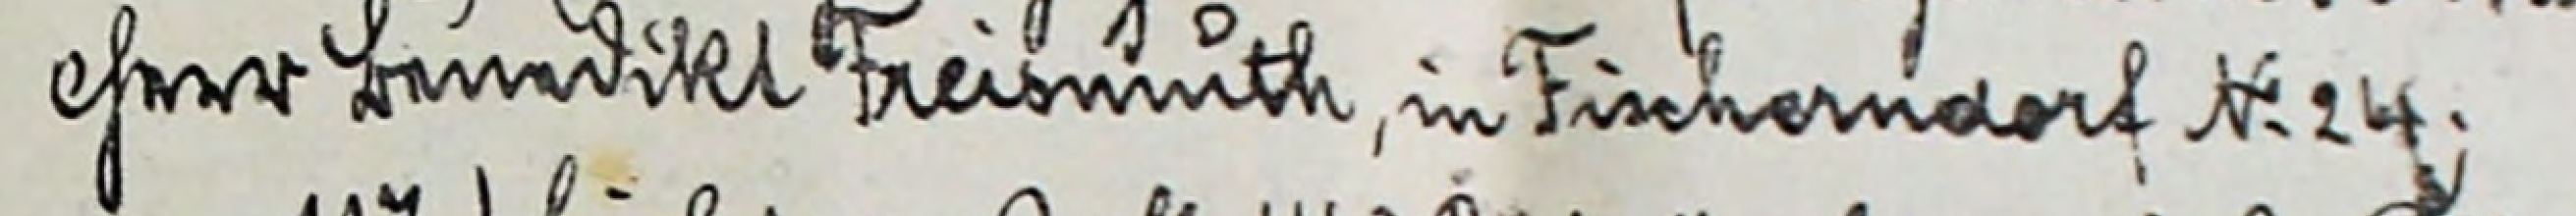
Herr Benedikt Freismuth, in Fischerndorf № 24;
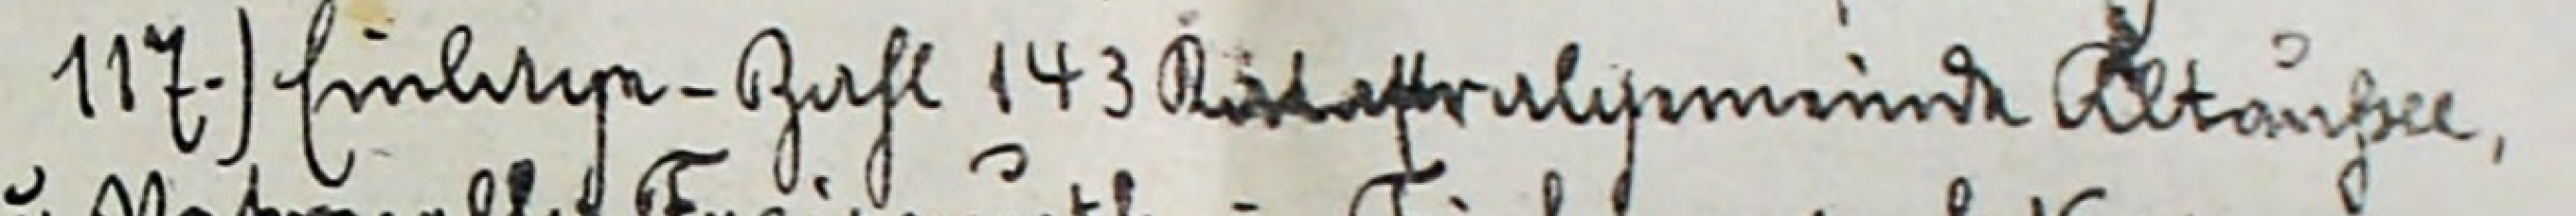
117.) Einlage - Zahl 143 Katastralgemeinde Altaussee,
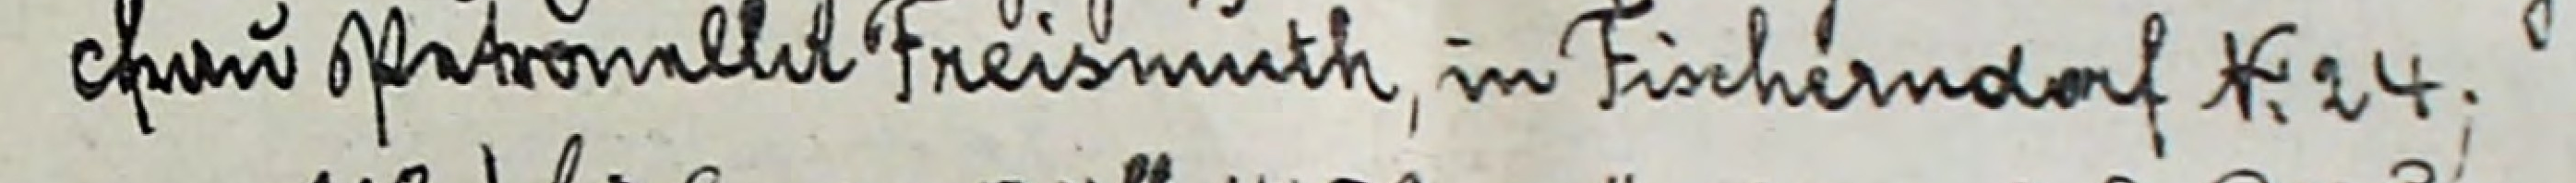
Frau Petronella Freismuth, in Fischerndorf № 24;
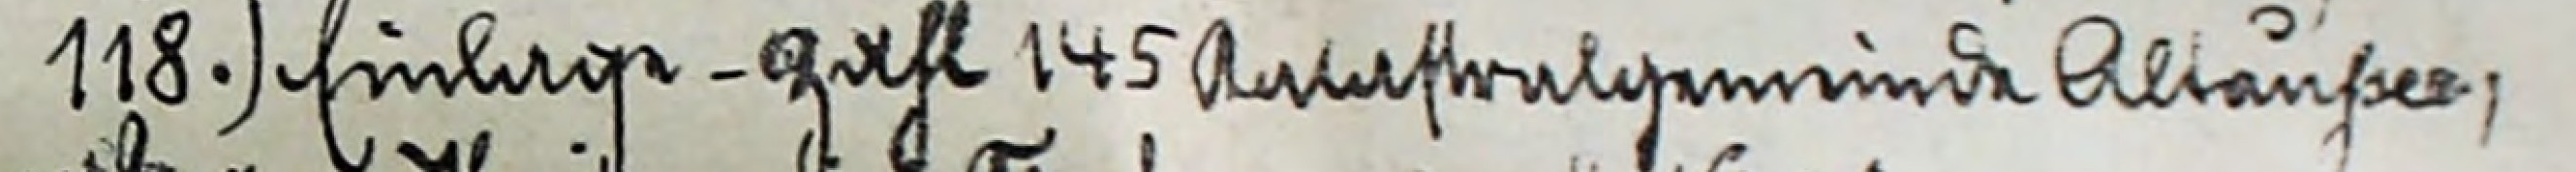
118.) Einlage - Zahl 145 Katastralgemeinde Altaussee,
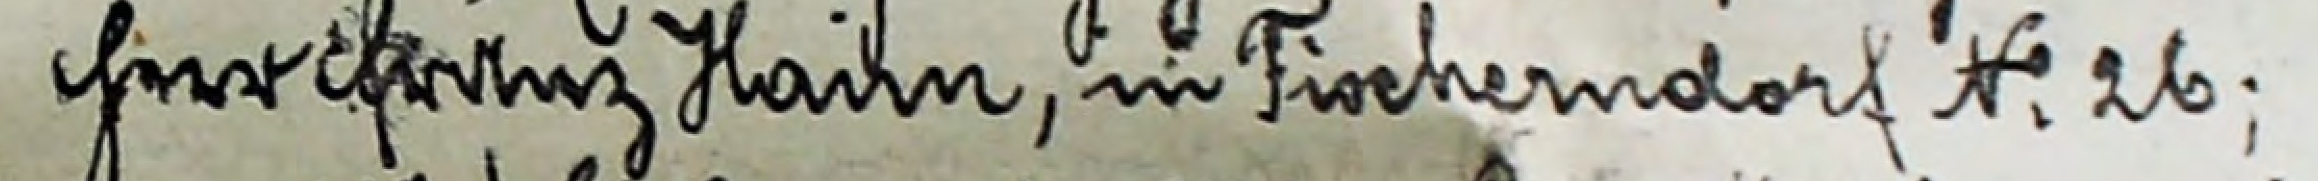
Herr Franz Haim, in Fischerndorf № 26;
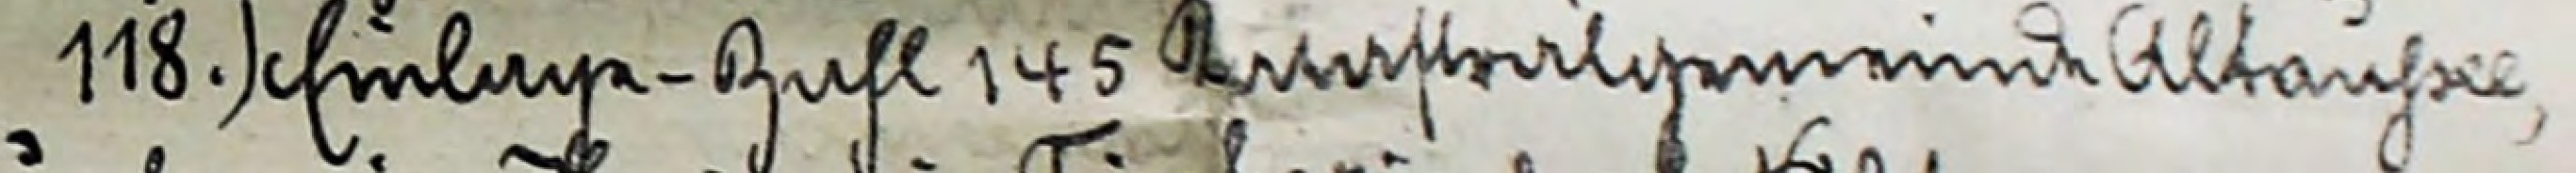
118.) Einlage - Zahl 145 Katastralgemeinde Altaussee,
